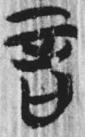言
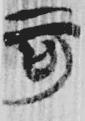可
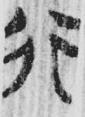行
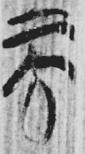而
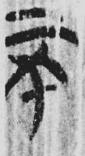不
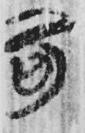可
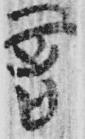言
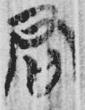君
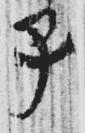子
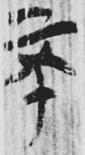不
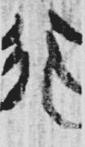行
